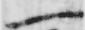一
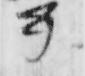邑
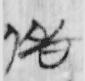俈
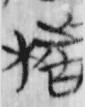楮
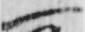一
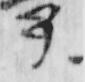邑
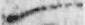一
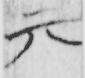亓
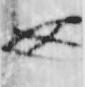女
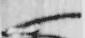一
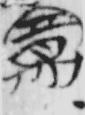賽
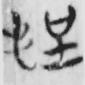浧
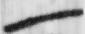一
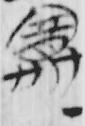賽
